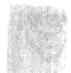階
